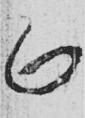㠯（以）
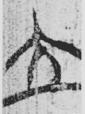立
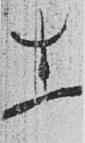生
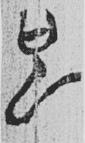也
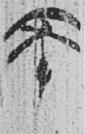不
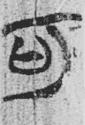可
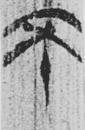不
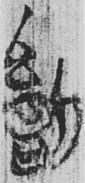○（慎）
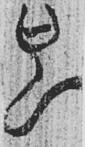也
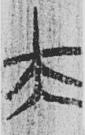夫
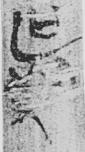○（死）
